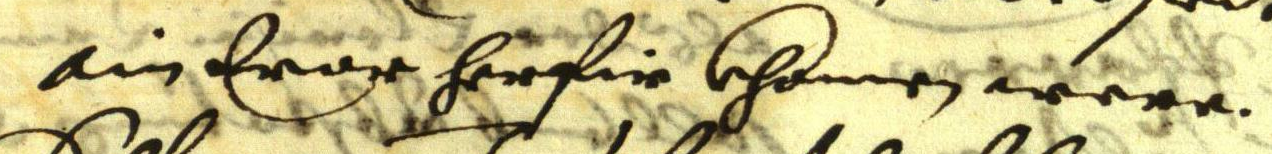ain Eror herfir khomen were.
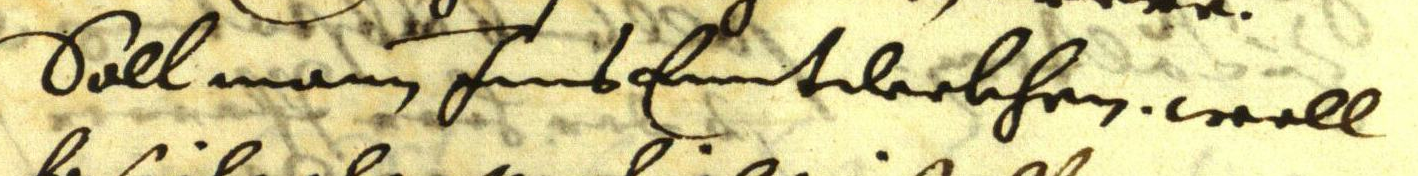Soll mann Ims Enntdeckhen. well
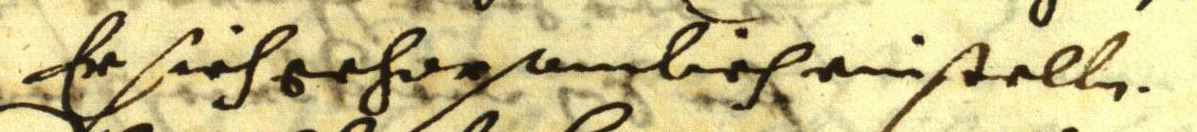Er sich gehorsamlich einstelln.
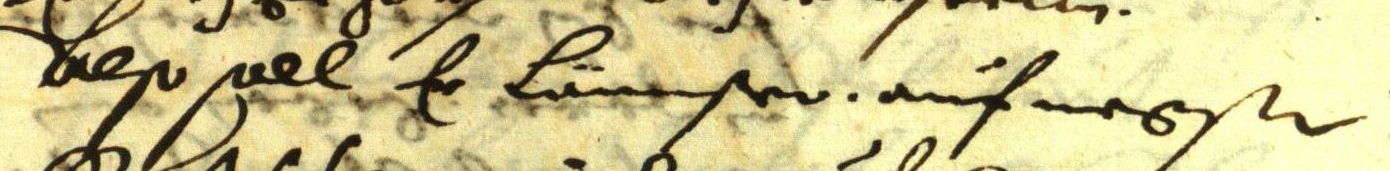Also soll Er Lännser. aūf negst
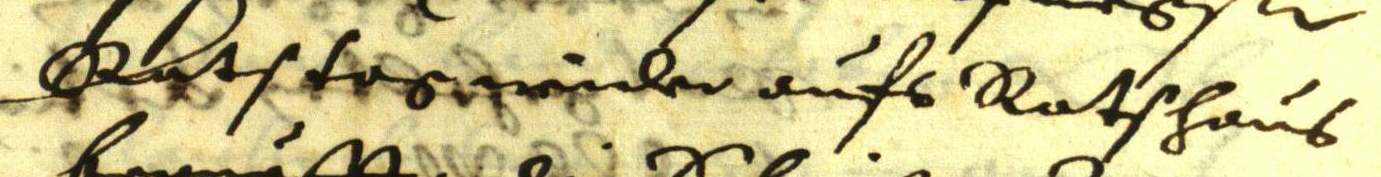Ratstag wider aūfs Ratshaūs
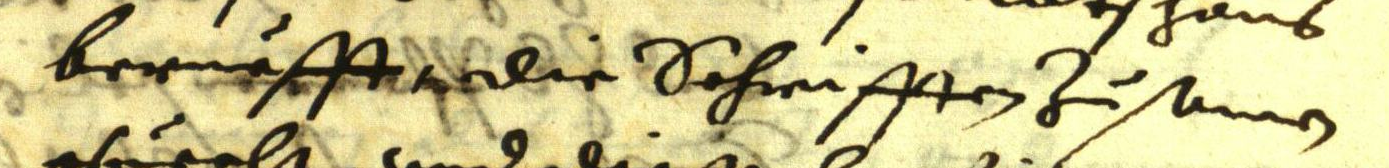berūefft, die Schrifften Zūsamen
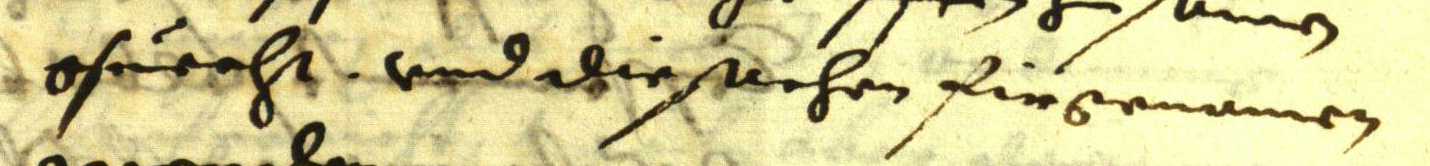gsūecht. vnd die sachen firgenomen
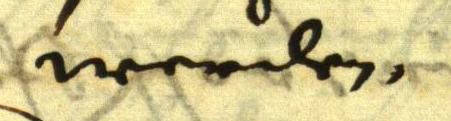werden,
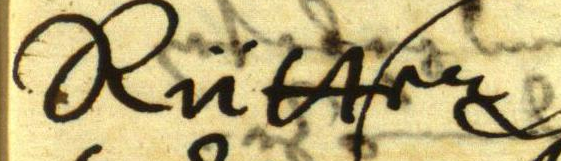Rütter
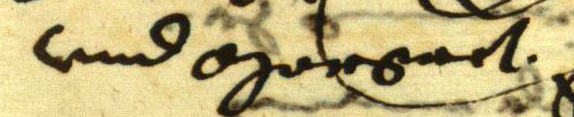vnd Morgret.
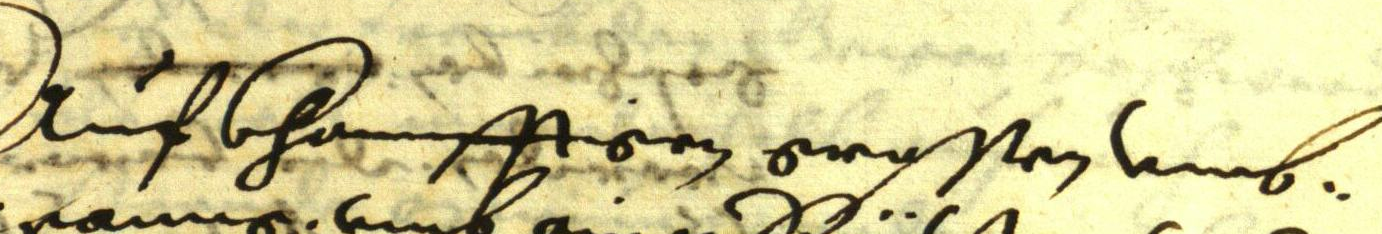Aūf Khonnfftigen grossen vmb¬
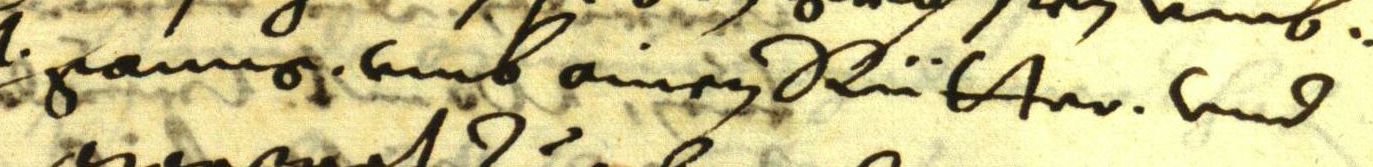ganng. vmb ainen Rütter. vnd
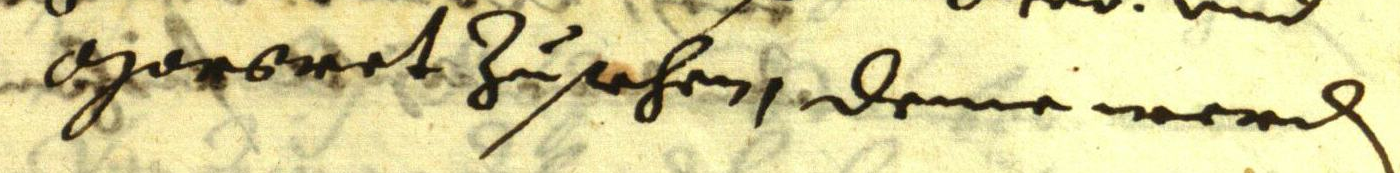Morgret Zū sehen, deme werd
